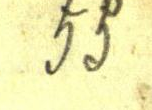55
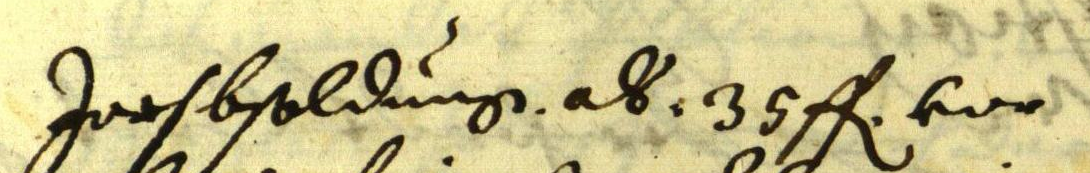Jarsbsoldūng. als. 35 fl. vor
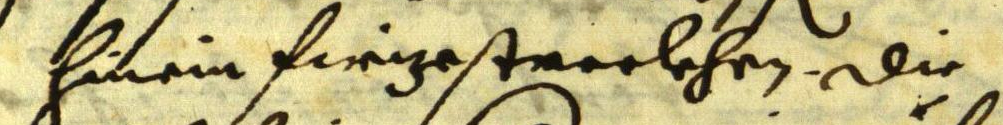hinein firzestreckhen. die
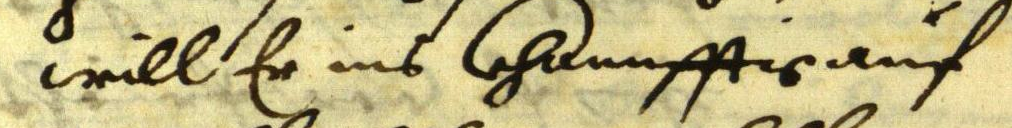will Er ins khonnfftig aūf
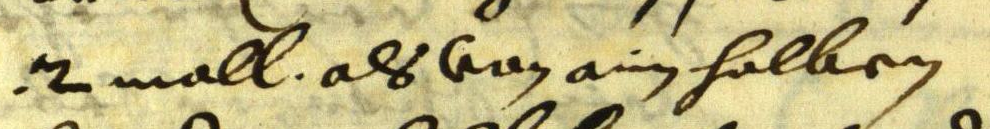.2 mall. als von aim halben
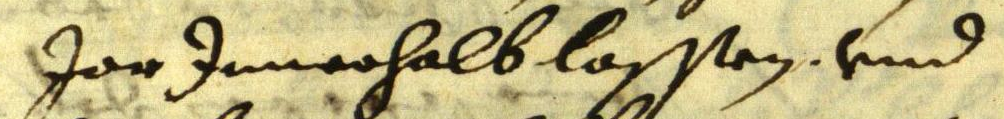Jar Innerhalb lassen. vnd
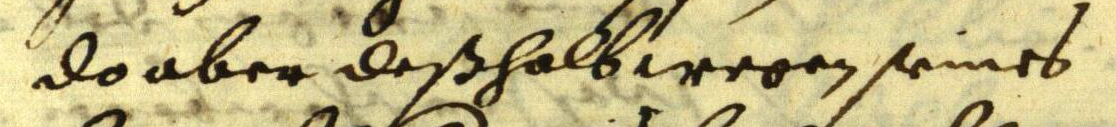da aber deßhalb wegen seines
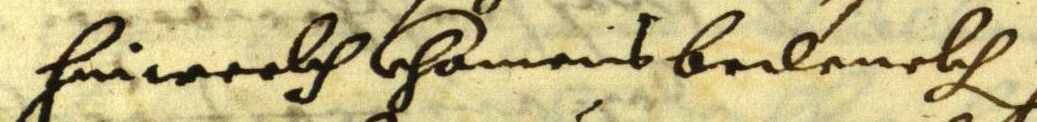hinweckh khomens bedenckh
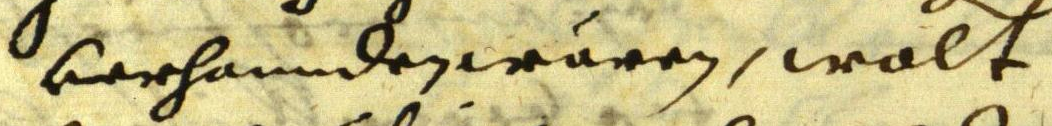verhannden waren, wolt
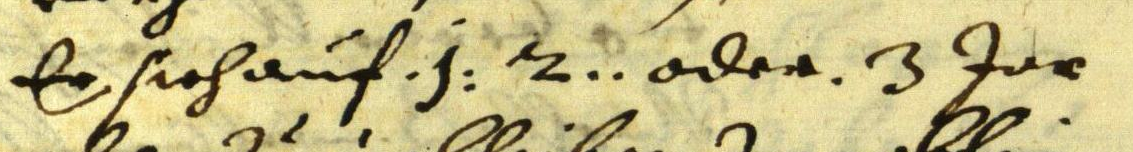Er sich aūf .1: 2.. oder. 3 Jar
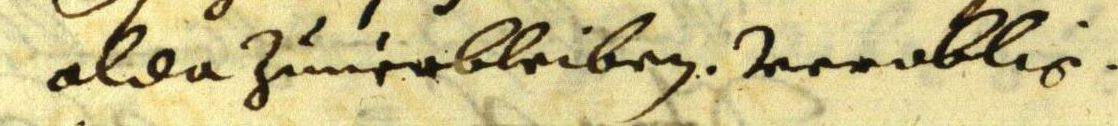alda Zūuērbleiben. veroblig¬
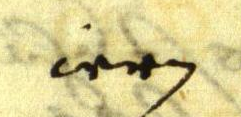ieren.
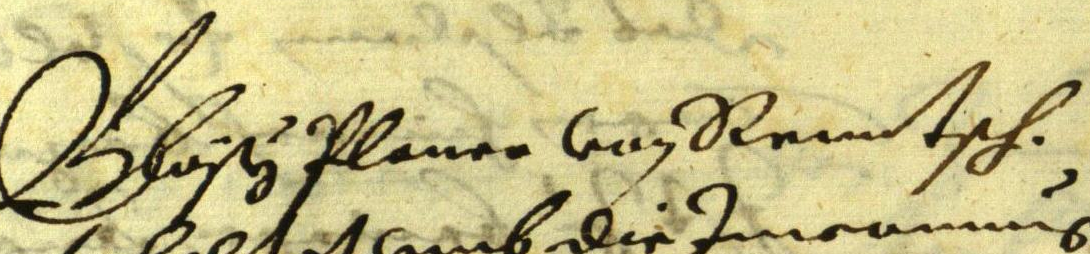Bläsȳ Planer von Renntsch.
